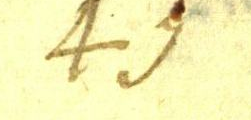41
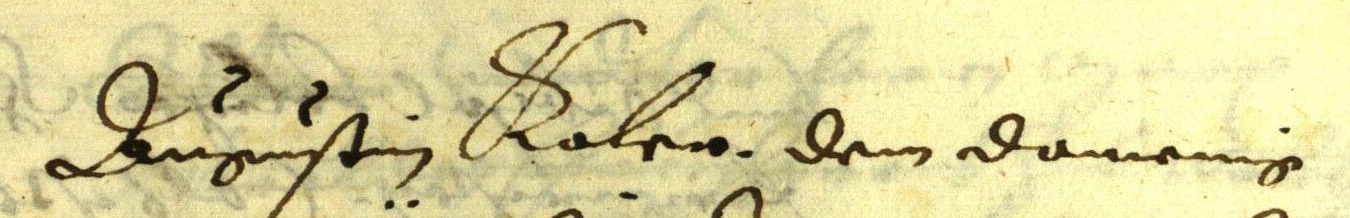Aūgūstin Koler. dem domenig
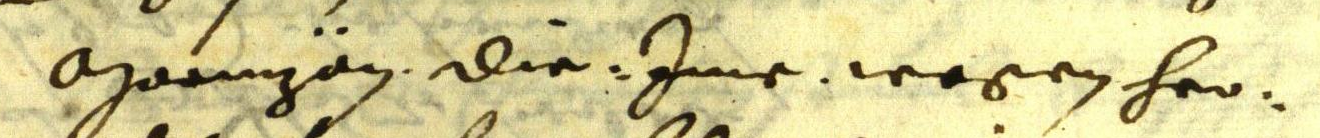Marnzän. die: Ime. wegen her¬
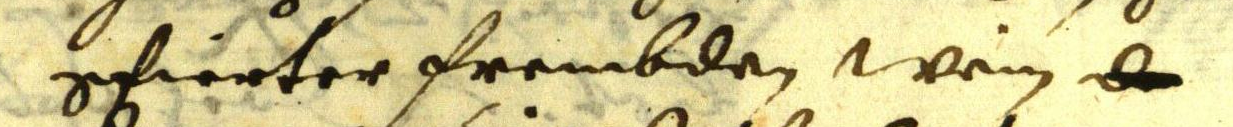gefierter frembden Wein der
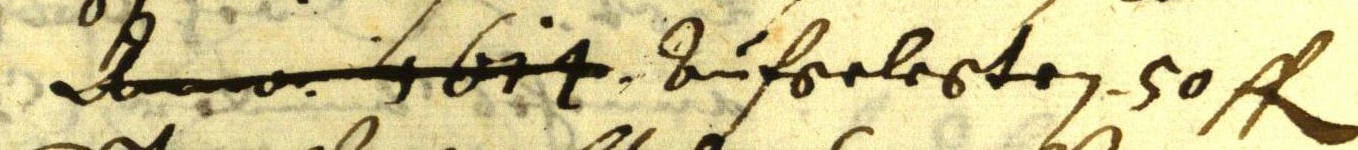Anno. 1614. Aūfgelegten 50 fl
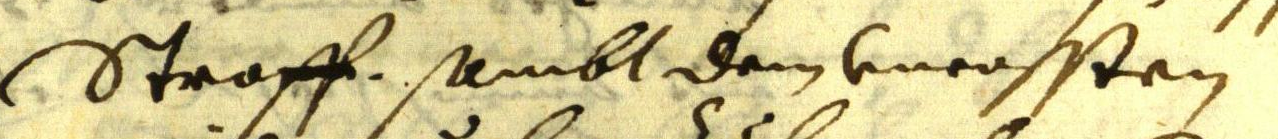Straff. sambt dem vncossten
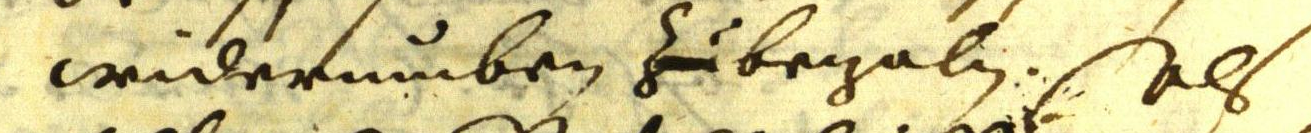widerūmben Zū bezaln. Als
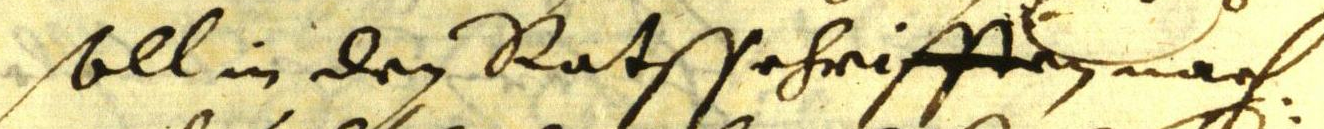soll in den Ratsschrifften nach¬
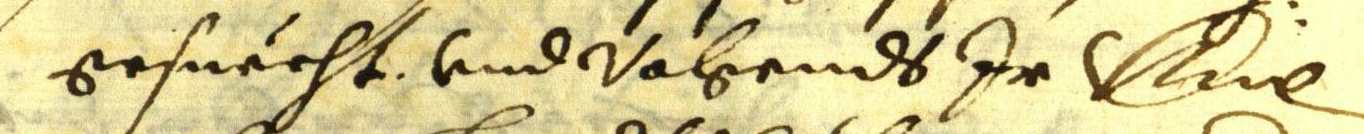gesūecht. vnd Volgends Ir Gn
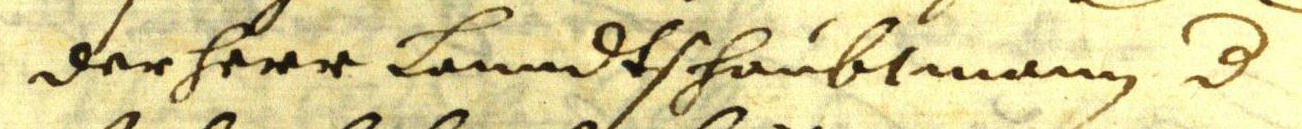der herr Lanndtshaūbtmann d
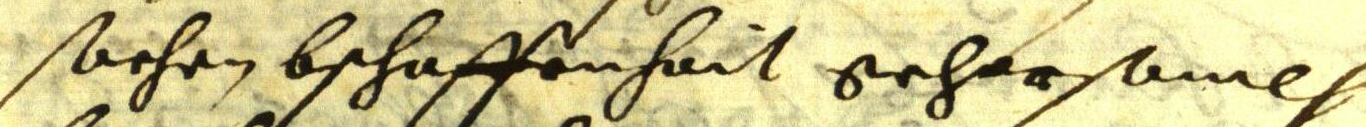sachen beschaffenhait gehorsamlich
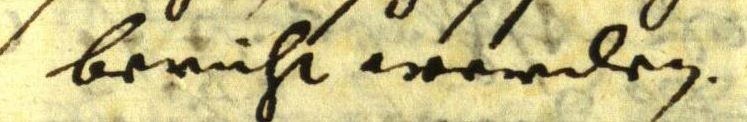bericht werden.
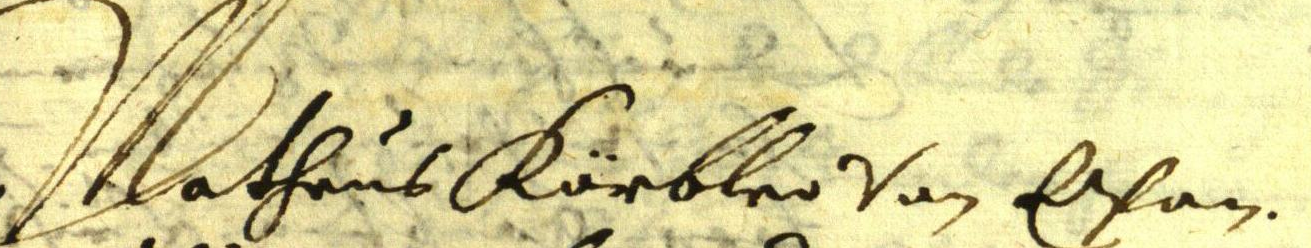Matheūs Körbler Von EPan.
